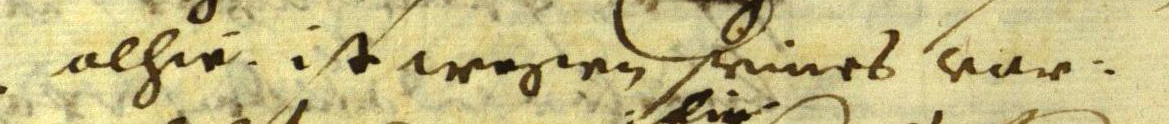alhie. ist wegen seines vor¬
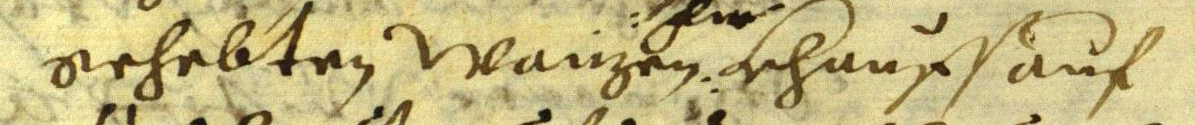gehebten Waizen: Khaūfs aūf
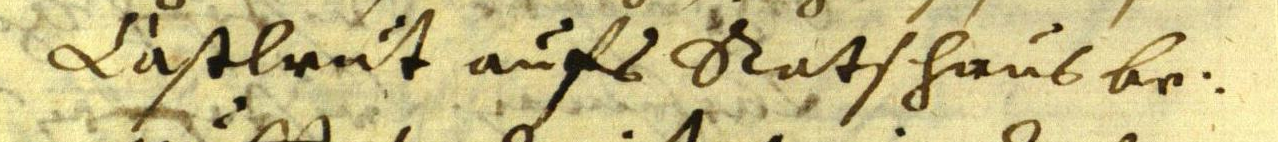Castlrūt aūfs Ratshaūs be¬
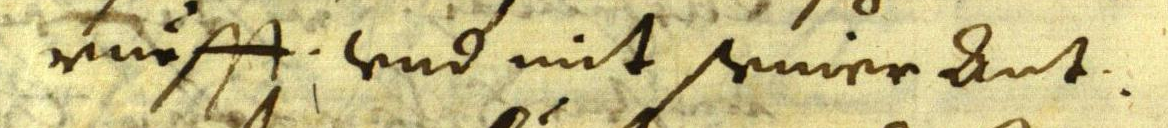rūefft vnd mit seiner Ant¬
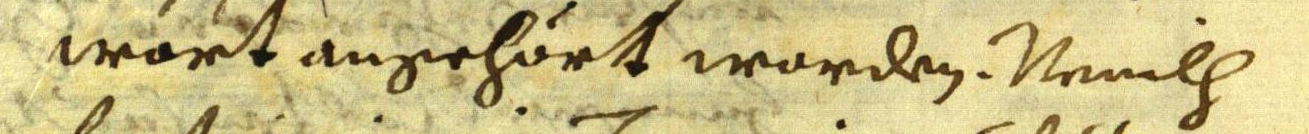wort angehōrt worden. Nemlich
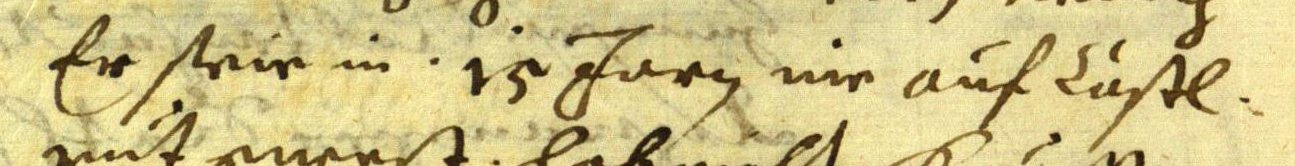Er seie in .15 Jarn nie aūf Castl¬
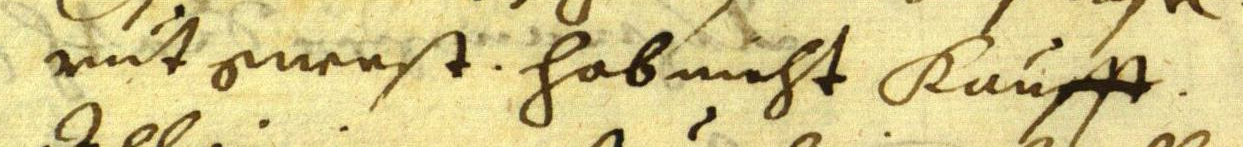rūt gwest. hab nicht Kaūfft.
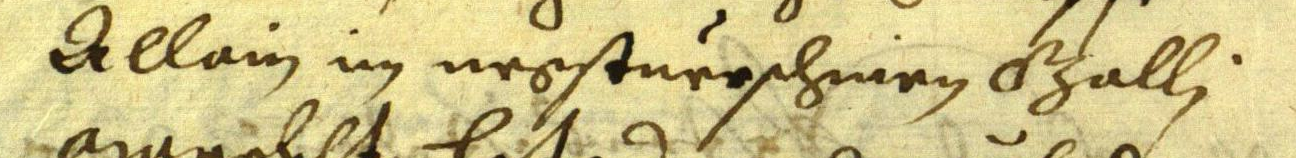Allain im negstvērschinen Gallj
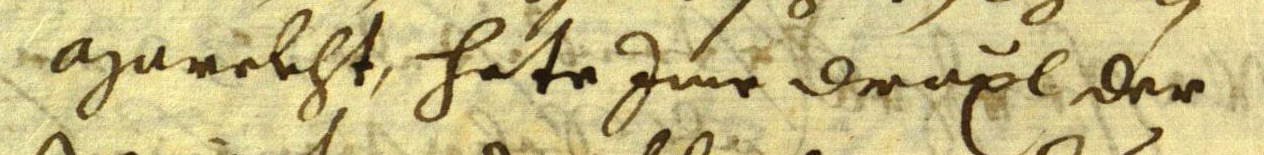Marckht, hete Ime drāxl der
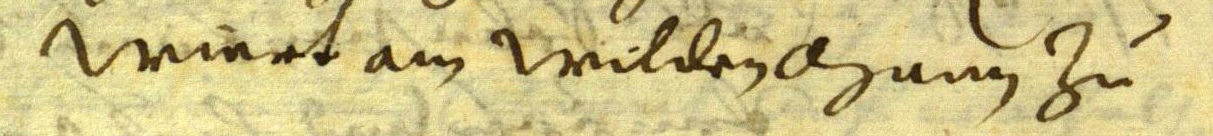Wiert am Wilden Mann Zū
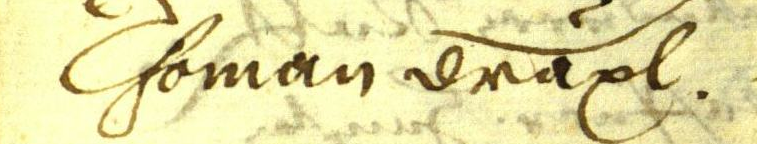Thoman drāxl.
